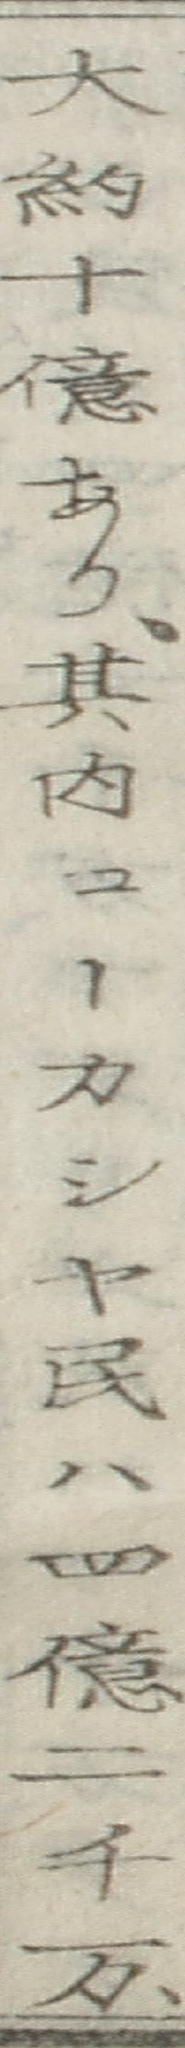大約十億あり、其内コーカシヤ民は四億二千万

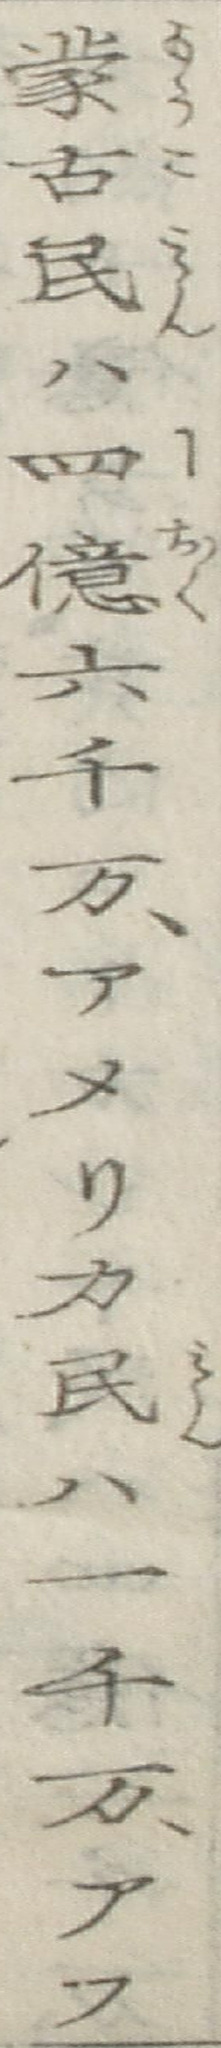蒙古民は四億六千万、アメリカ民は一千万、アフ
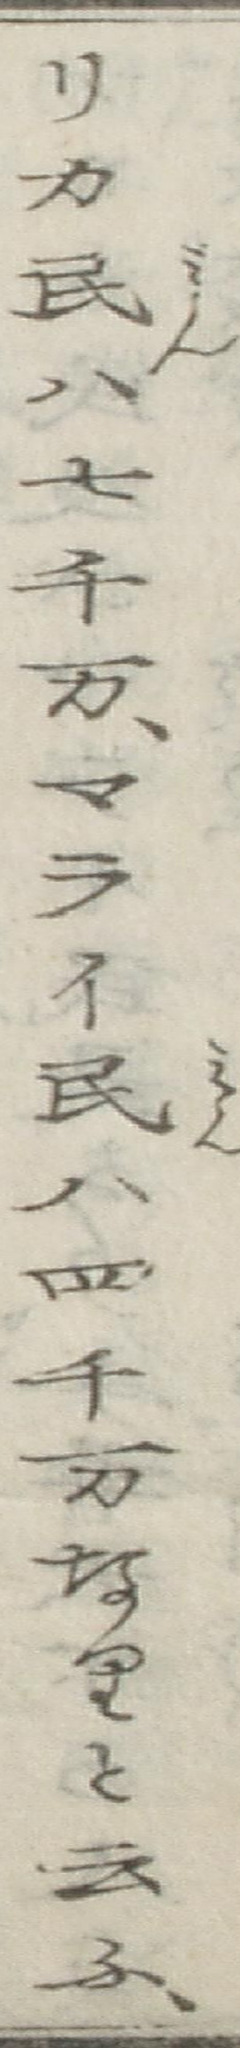リカ民は七千万、マライ民は四千万なりと云ふ、
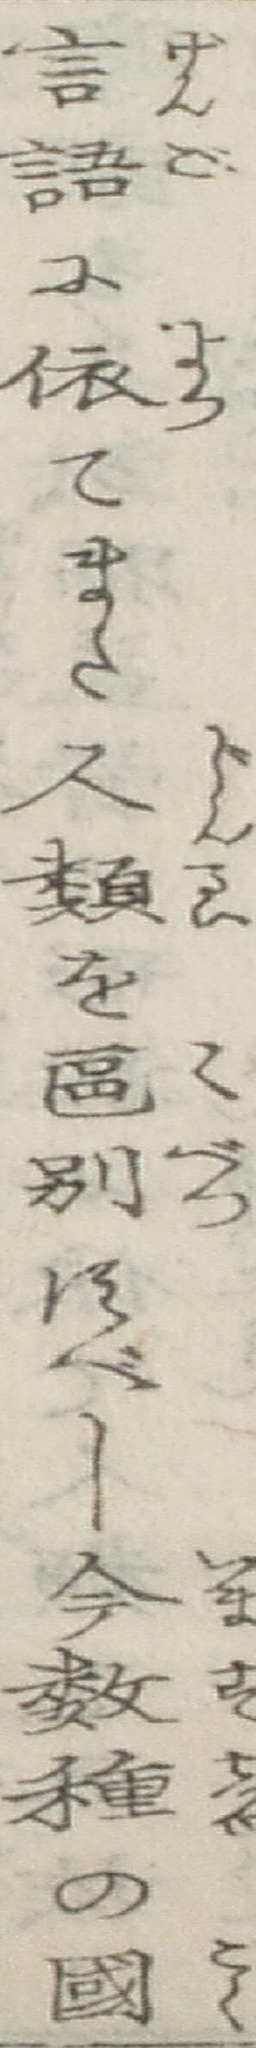言語に依てまた人類を区別すべし今数種の国
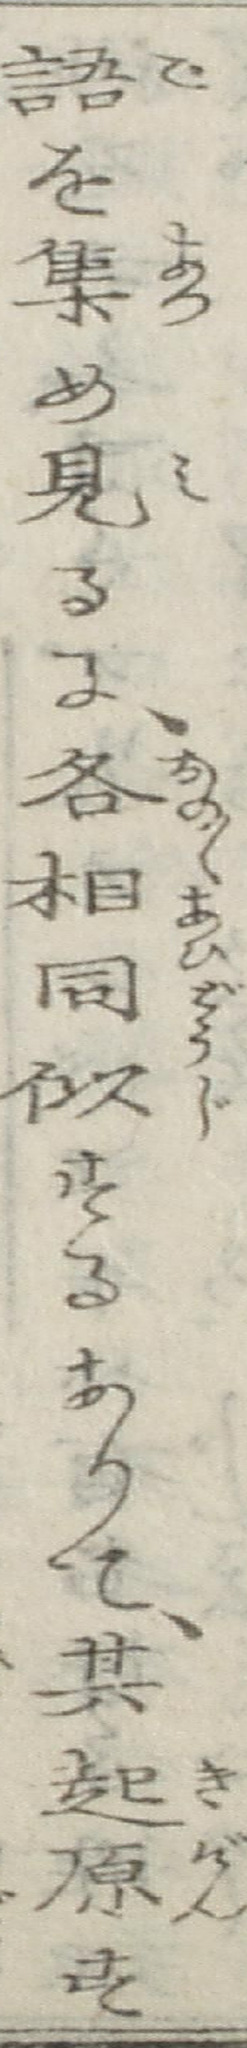語を集め見るに、各相同似するありて、其起原す
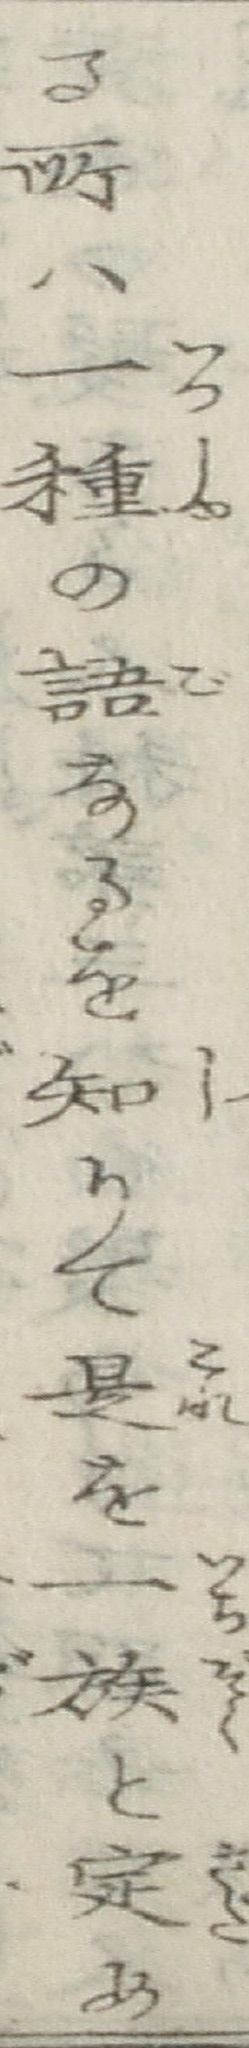る所は一種の語なるを知りて是を一族と定め
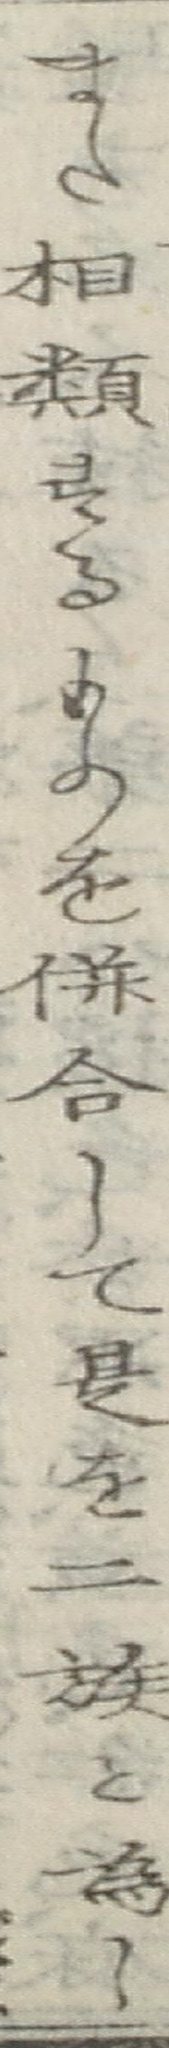また相類するものを併合して、是を二族と為し
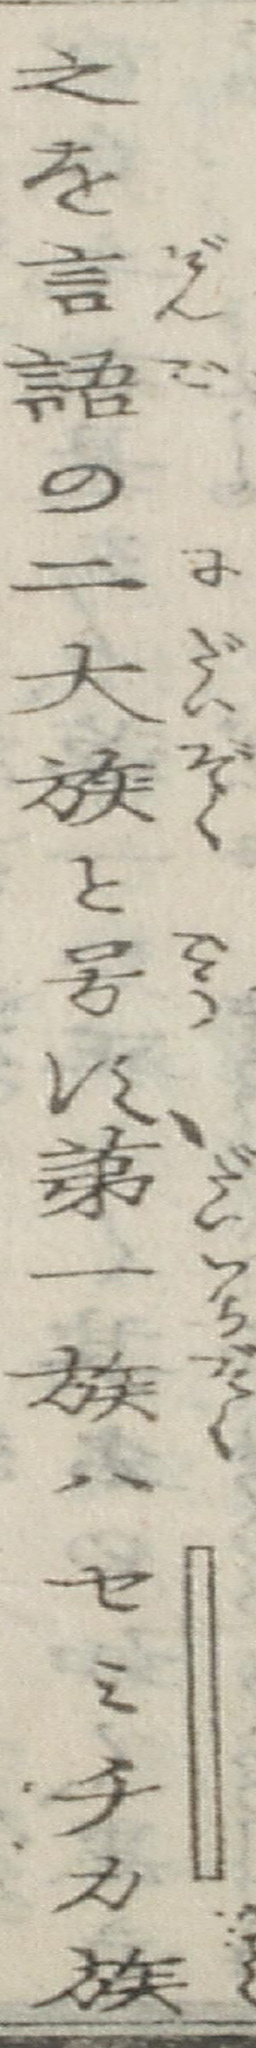之を言語の二大族と号す、第一族はセミチカ族
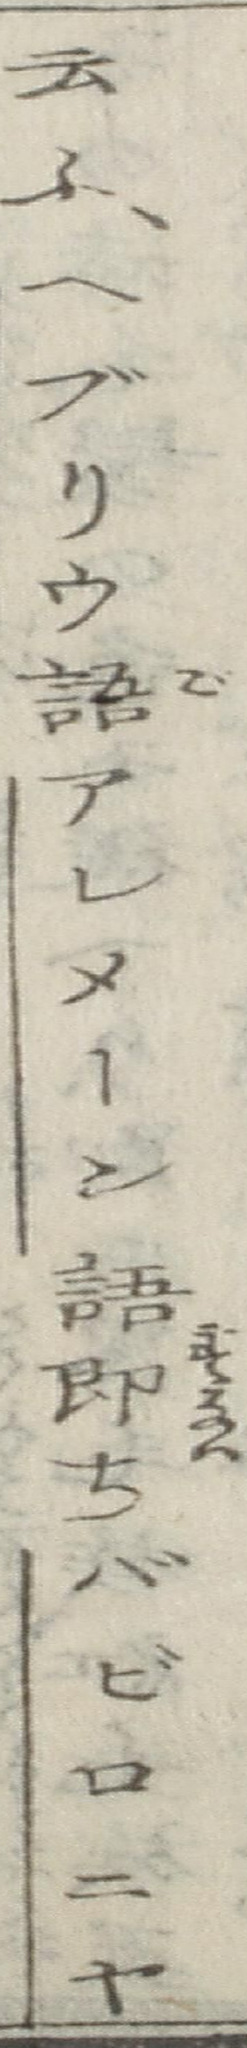云ふ、ヘブリウ語アレメーン語即ちバビロニヤ
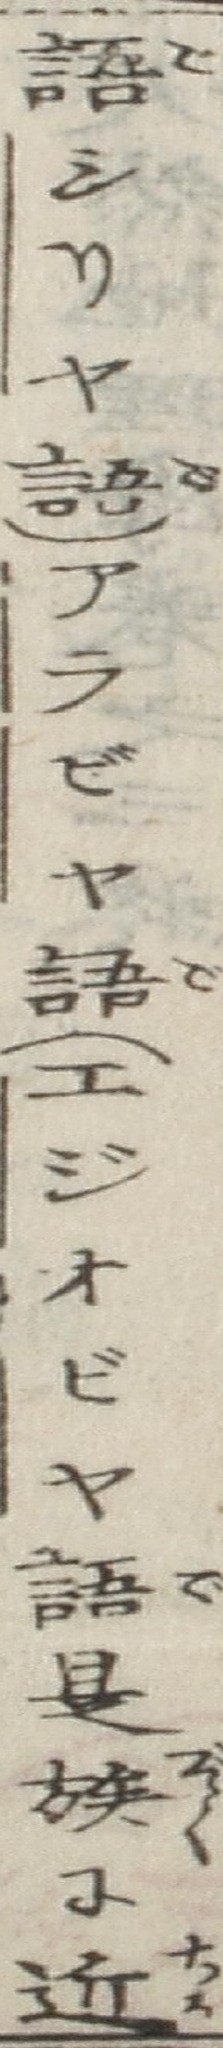語シリヤ語）アラビヤ語是族に近
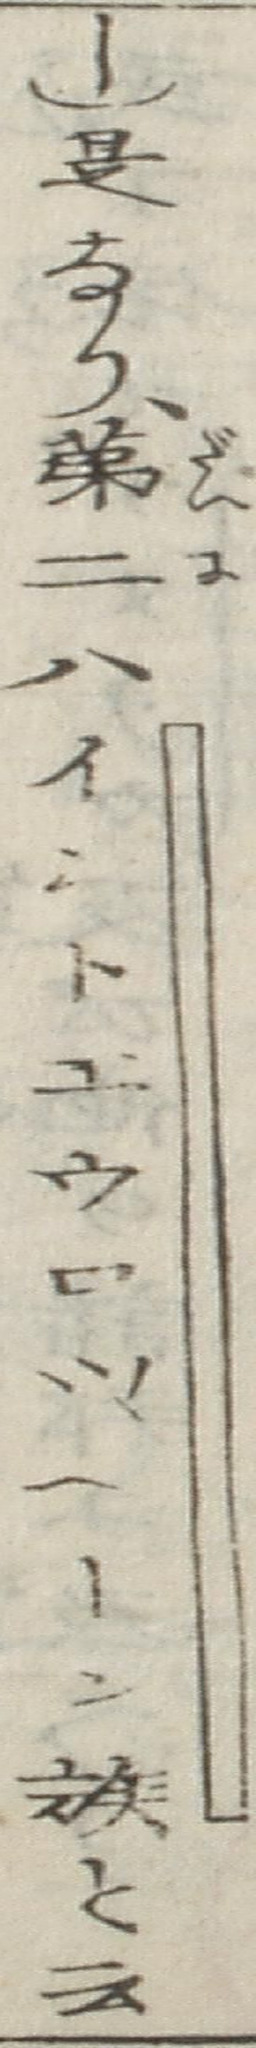し）是なり、第二はイントエウロツヘーン族と云
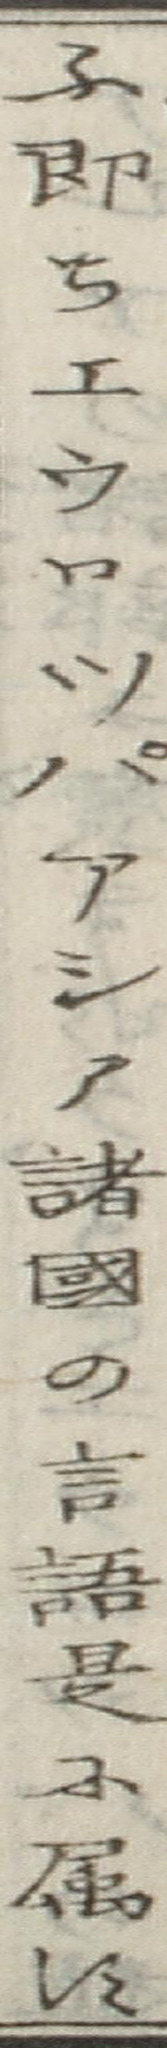ふ、即ちエウロツパアシア諸国の言語是に属す
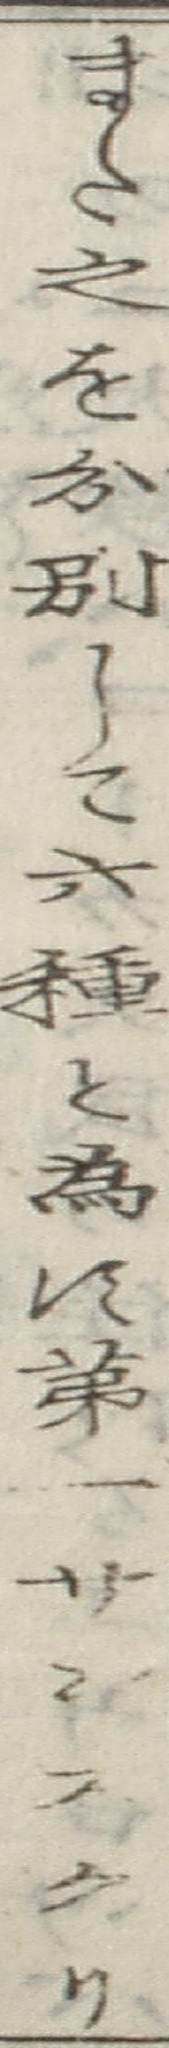また之を分別して六種と為す第一サンスクリ
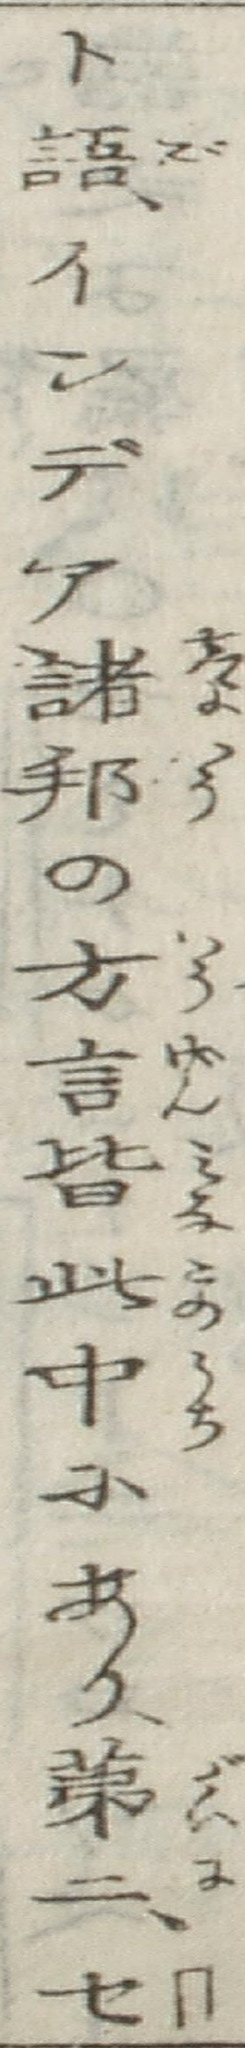ト語、インデア諸邦の方言皆此中にあり、第二、セ
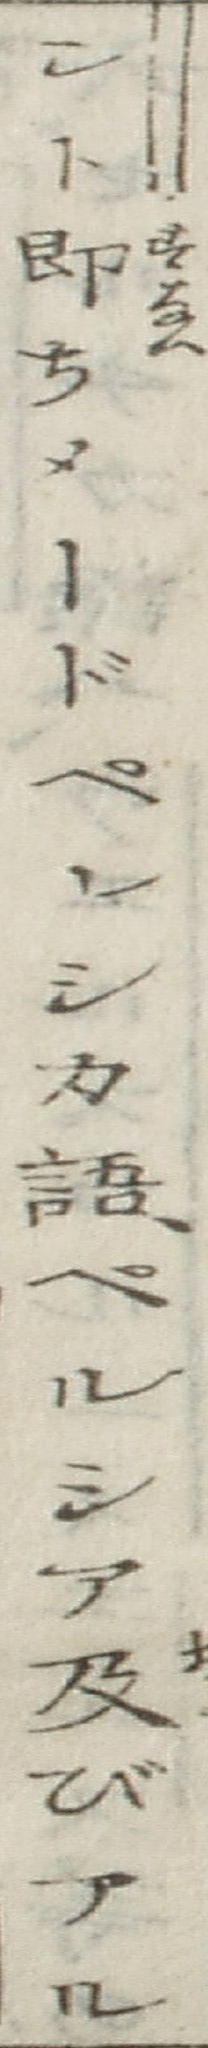ント即ちメードペレシカ語、ペルシア及びアル
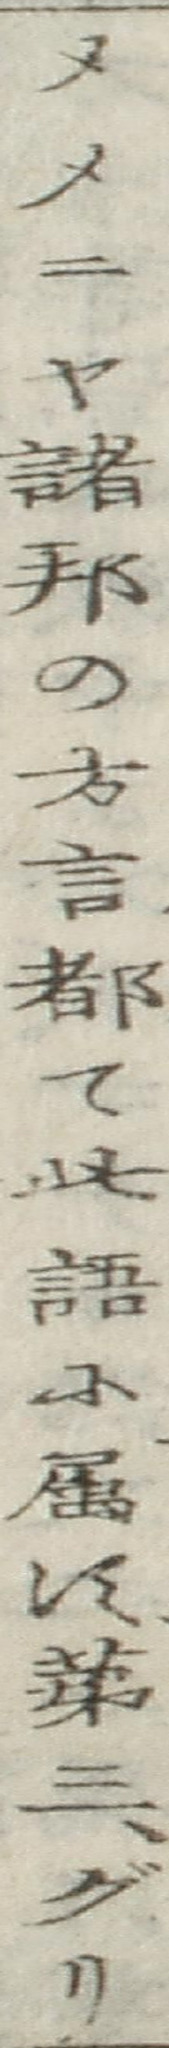メメニヤ諸邦の方言都て此語に属す、第三、グリ
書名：訓蒙　天然地理學　下
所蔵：東京大学地震研究所図書室 Earthquake Research Institute Library, The University of Tokyo, JAPAN
